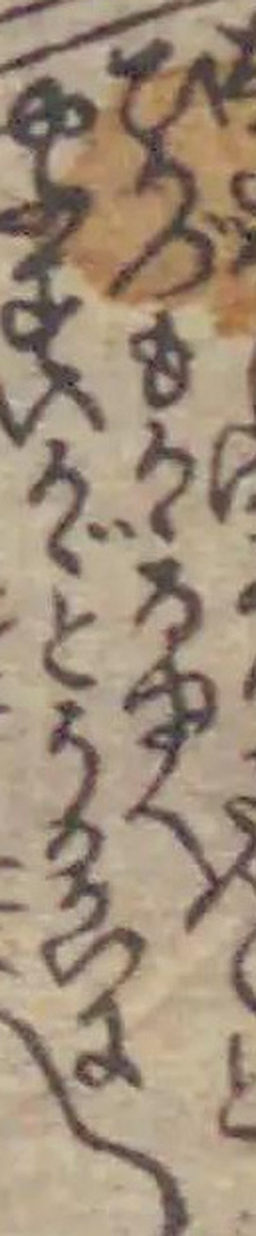やふすいかゞとうかかいに
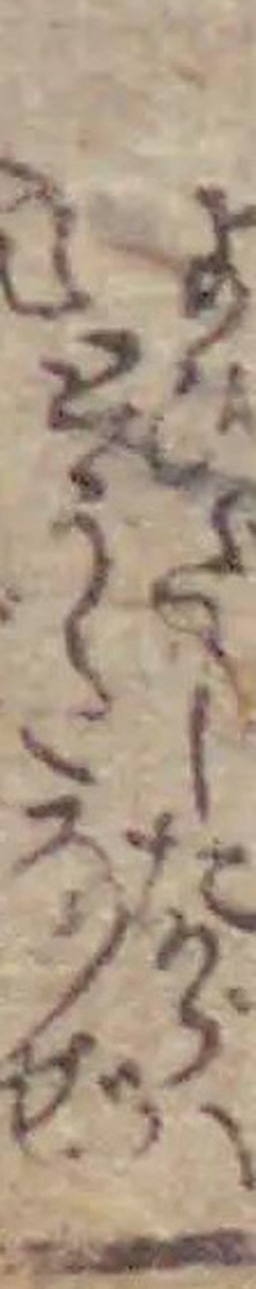とうたなぜ
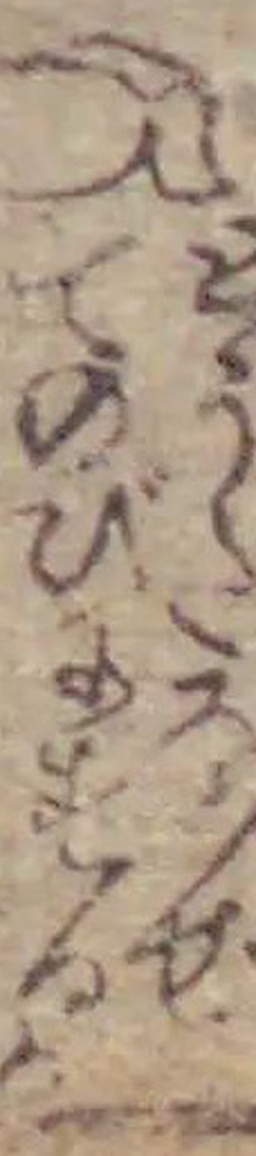てのびにするか
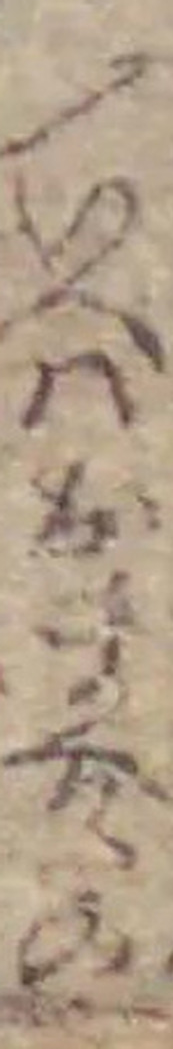いへはおまへかたの
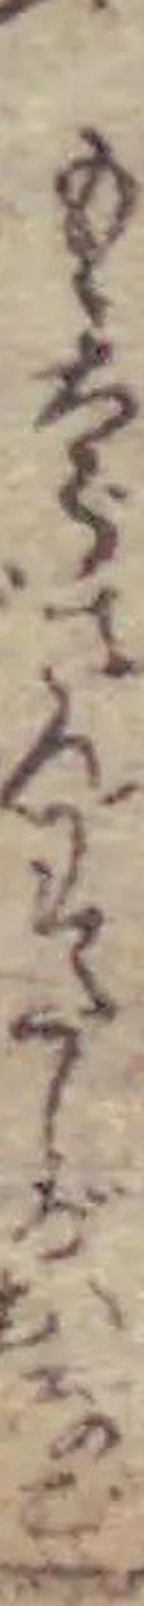もゝ太郎さんわたしがおなご
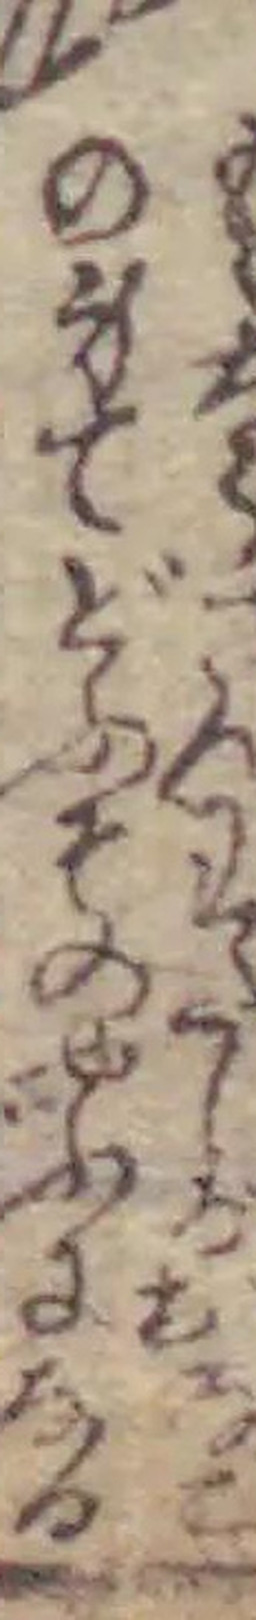の身てどふそのやふになる
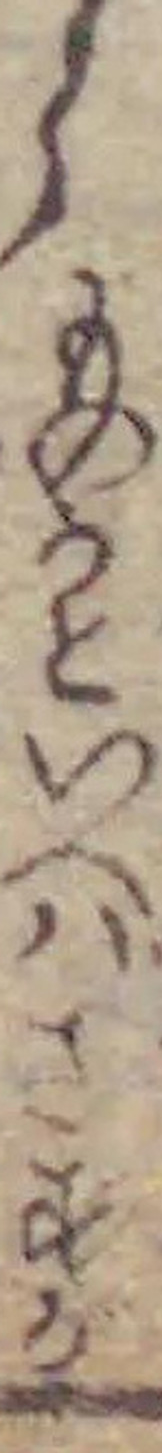ものかといへばさすが
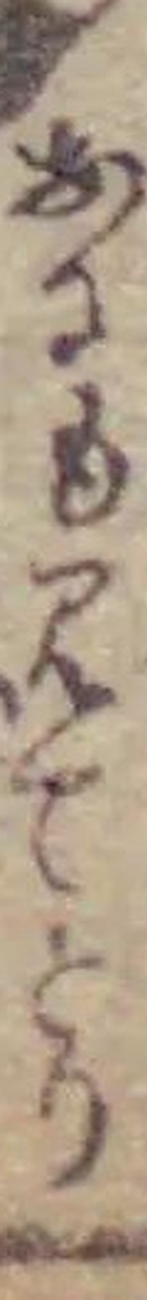おにも見てとり
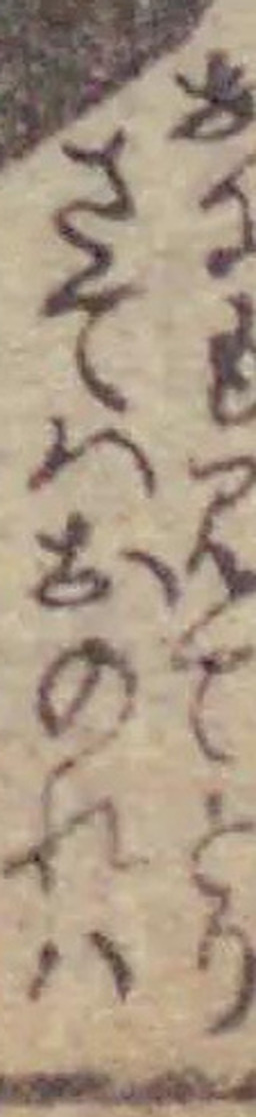さてはおのれは
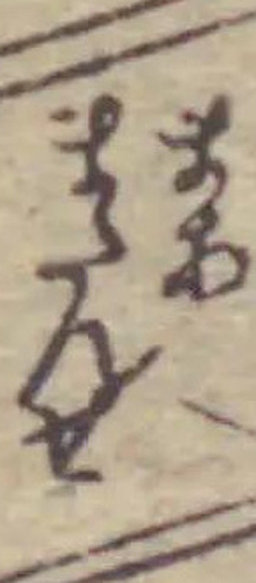またんせ
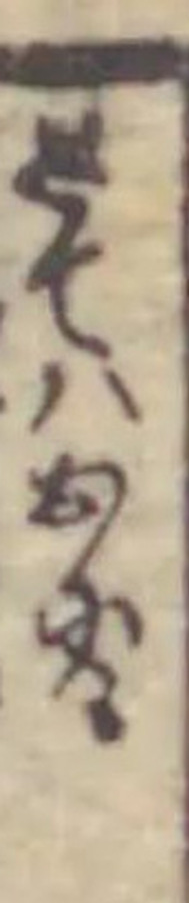さてはおにか
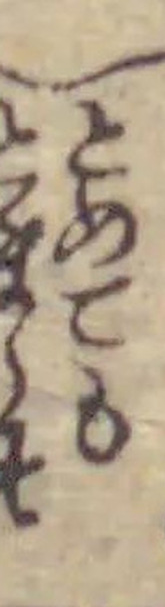とめても
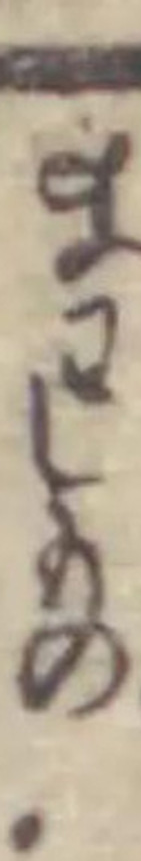まわしもの
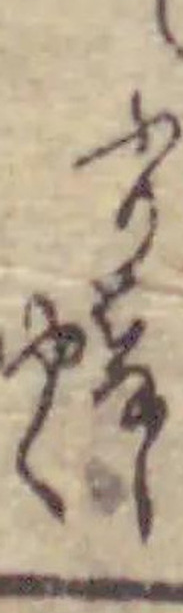ふりはなし
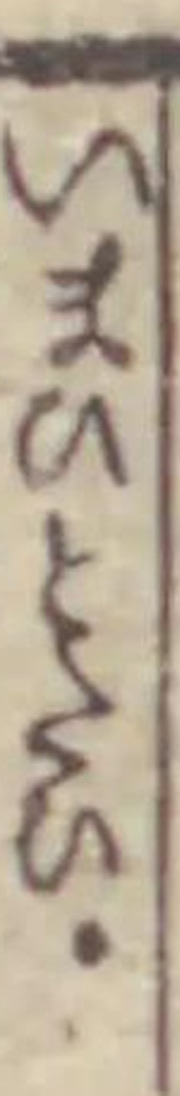いまひとたひ
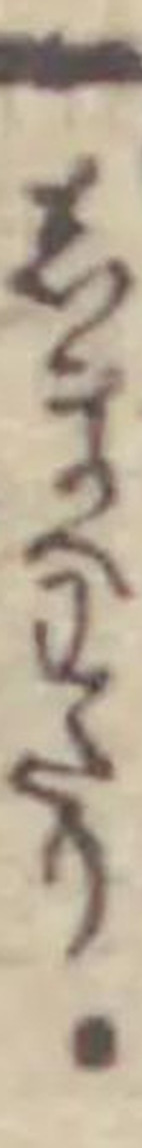しまへわたり
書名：桃太郎元服姿 2巻
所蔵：国立国会図書館 National Diet Library, JAPAN
